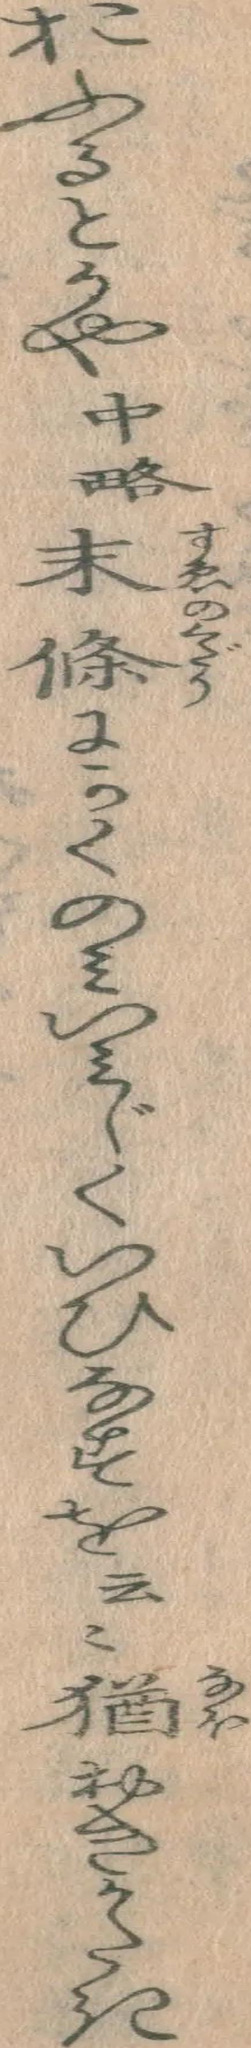おふるとかや中略末条にかくのみいみじくいひなすを云々猶おきかたき
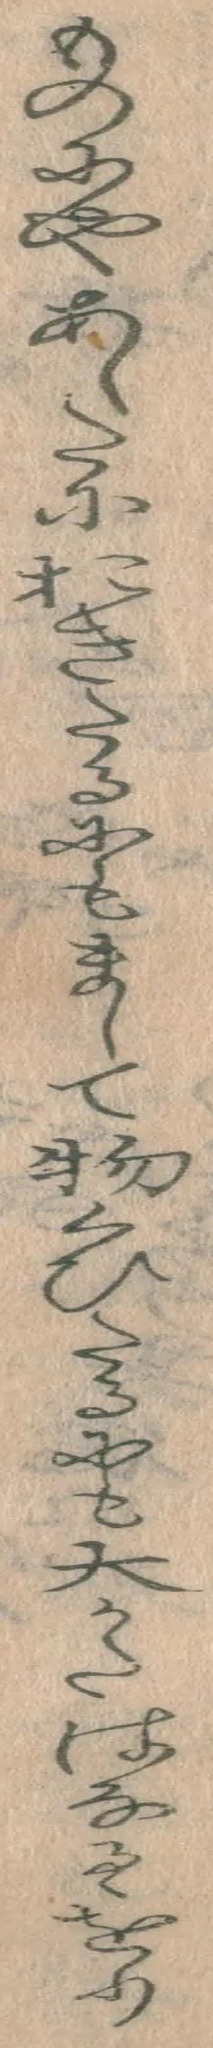ものにやあしたにおきたるにもまして物くひたるにも大かたはなるゝをり
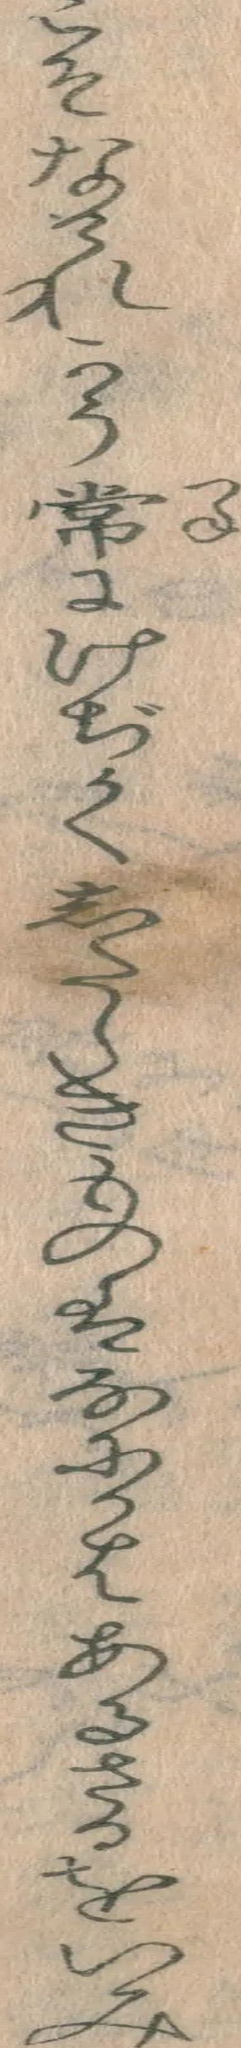こそなけれかう常にけぢかくしたしきものはなにかはあるさるをいみ
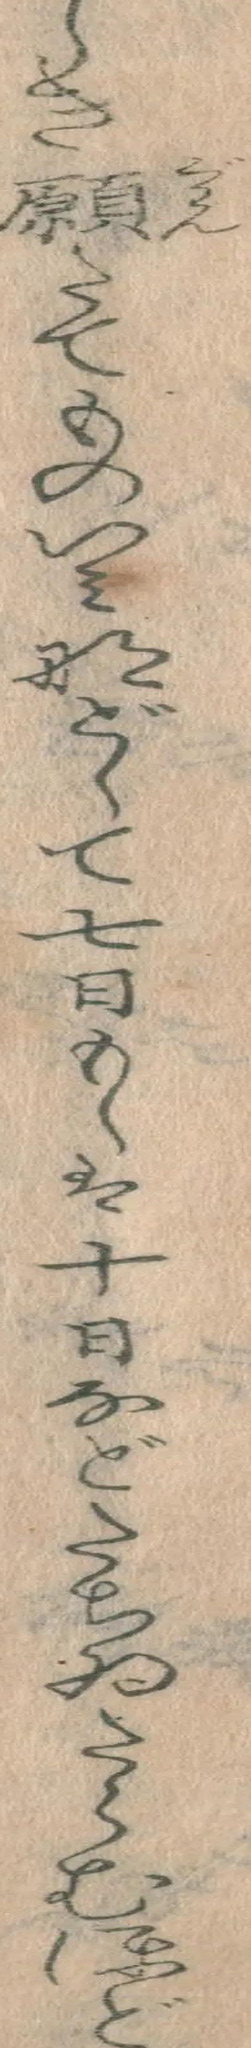しき願たてものいみなどして七日もしは十日などたちゐたらむほど
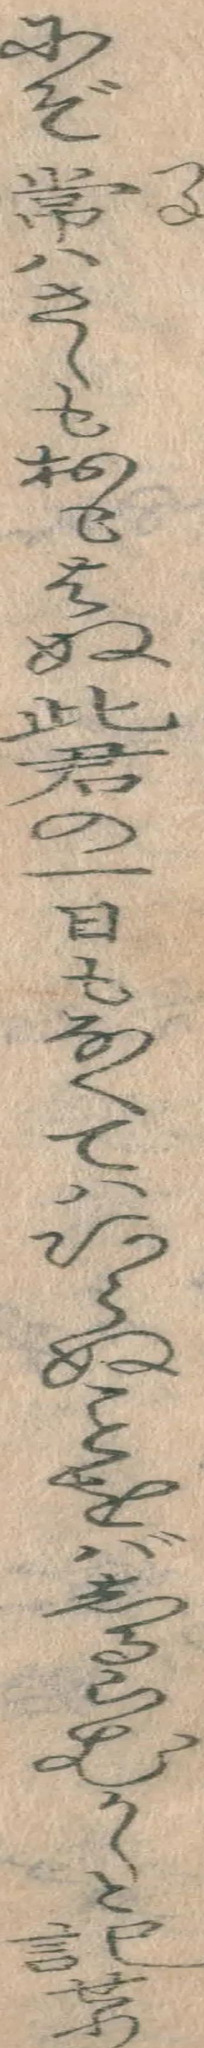にぞ常はさしもおもはぬ此君の一日もなくてはあらぬことをばしるらむかしと記せり
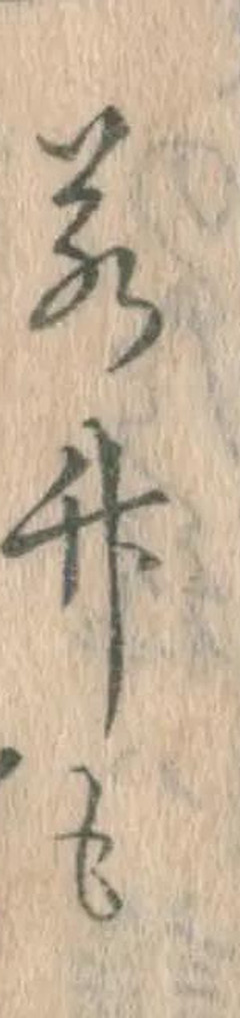若竹も

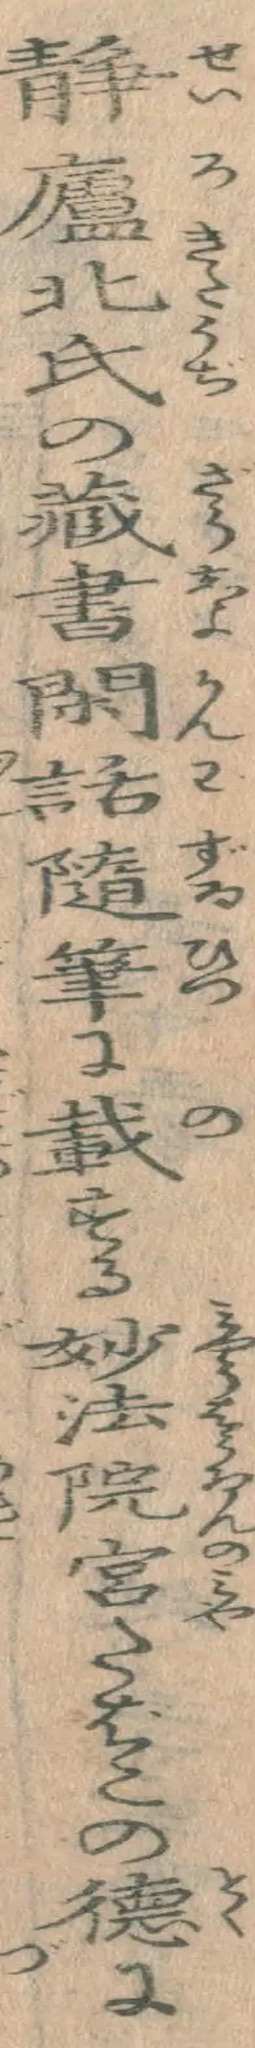静盧北氏の蔵書閑話随筆に載する妙法院宮たばこの徳に
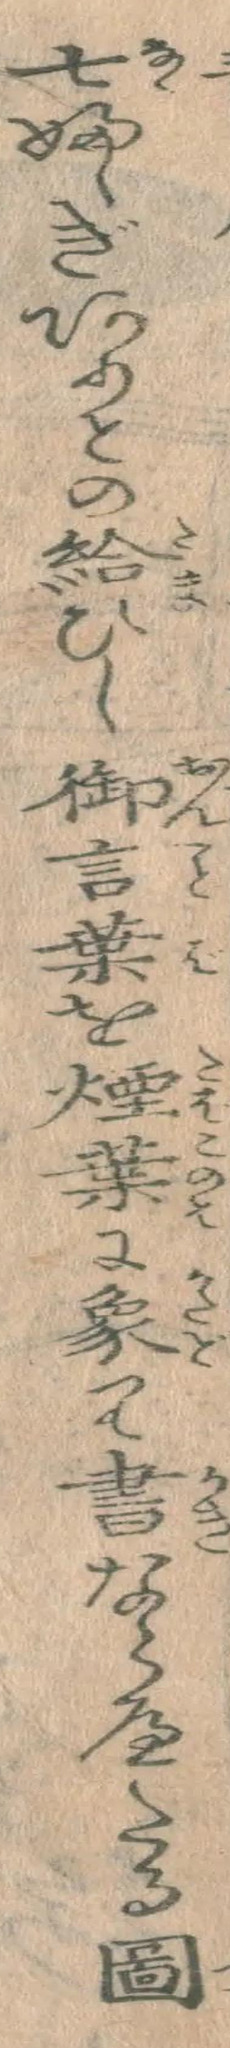七ふしぎありとの給ひし御言葉を煙葉に象り書ならへたる図
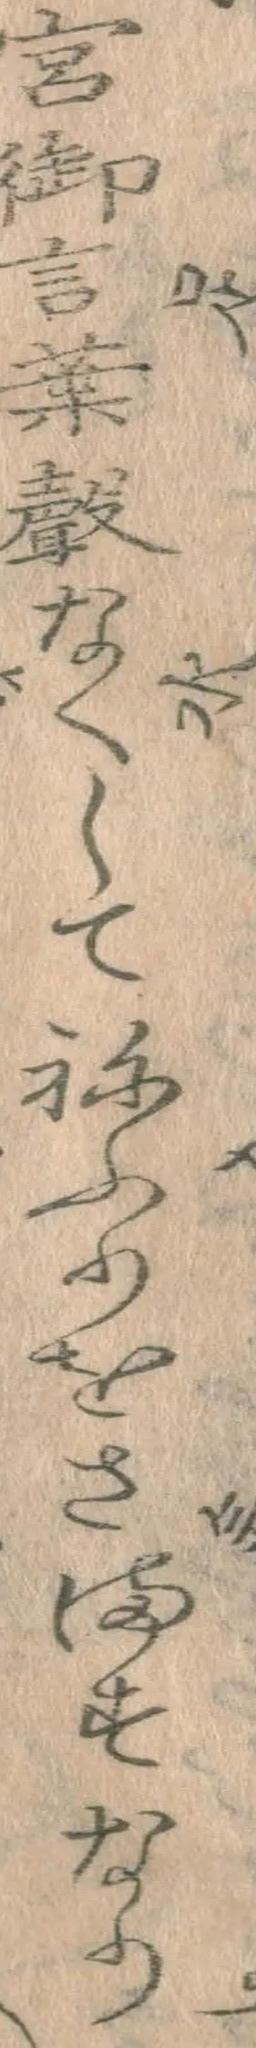宮御言葉声なくしてねふりをさますなり
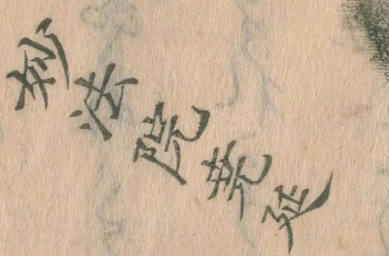妙法院尭延
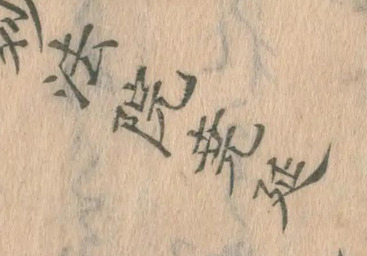妙法院尭延
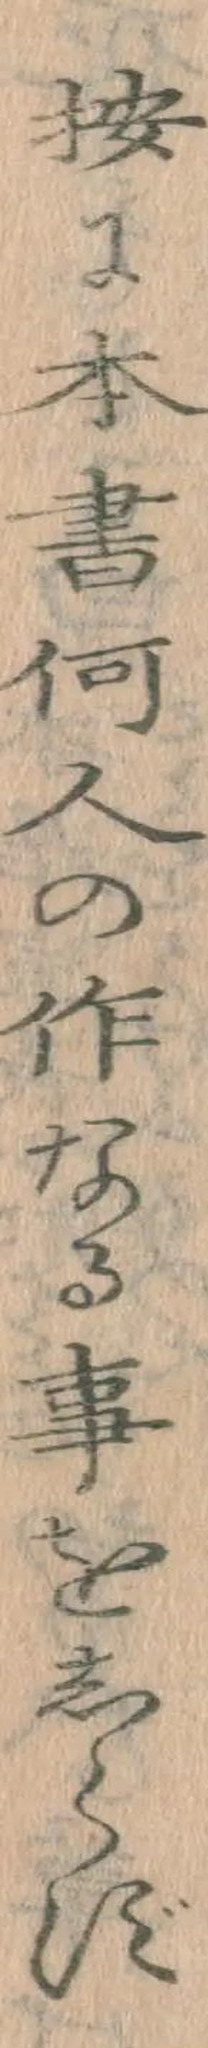按に本書何人の作なる事をしらず
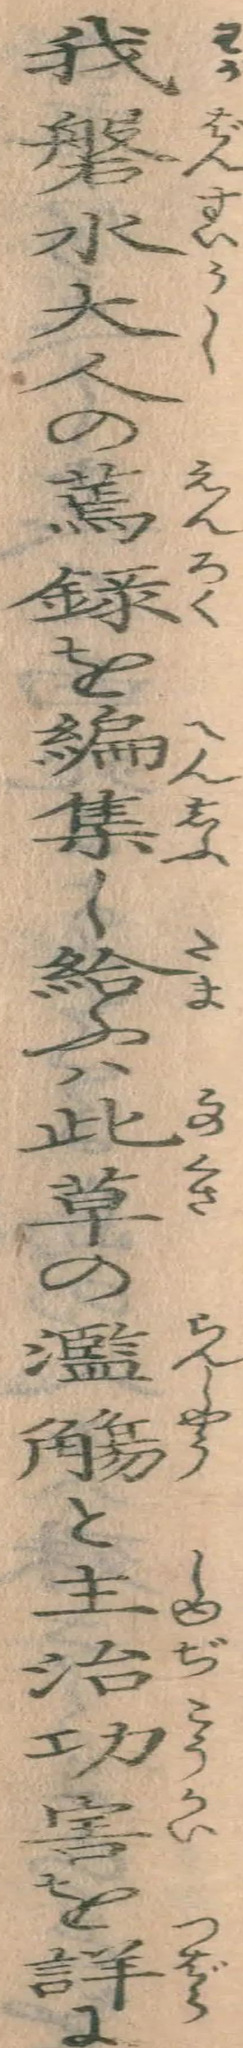我磐水大人の蔫録を編集し給ふは此草の濫觴と主治功害を詳に
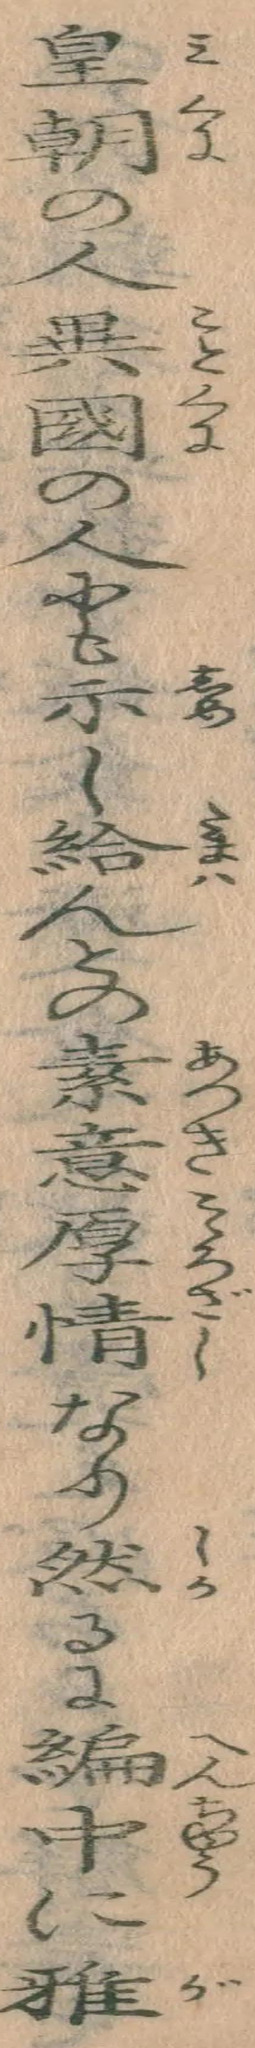皇朝の人異国の人にも示し給んとの素意厚情なり然るに編中に雅
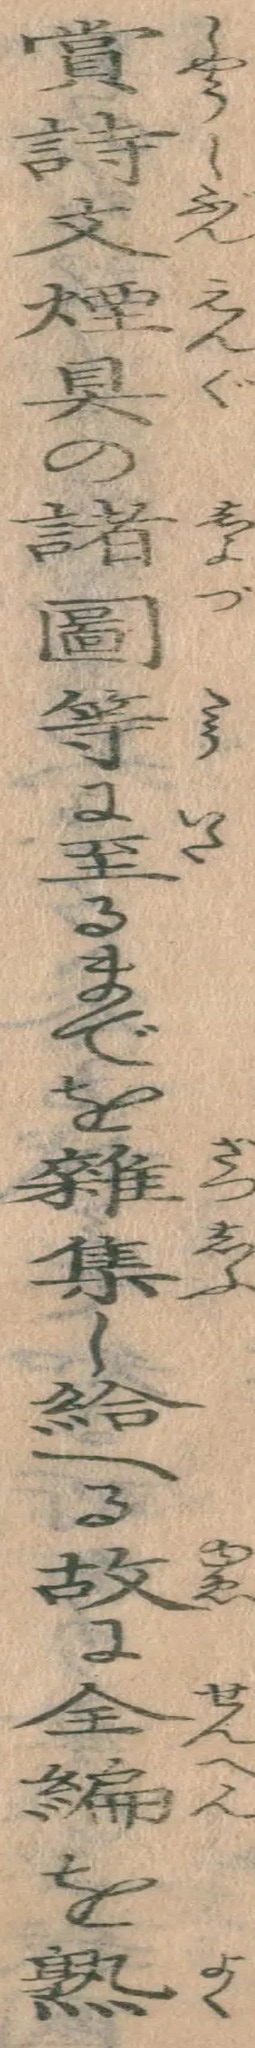賞詩文煙具の諸図等に至るまでを雑集し給へる故に全編を熟
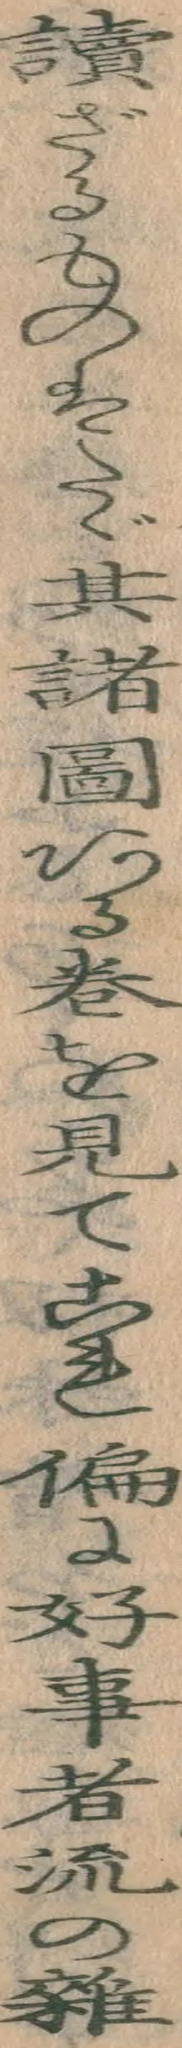読ざるものはたゞ其諸図ある巻を見てこれ偏に好事者流の雑
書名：目さまし草
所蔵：国立国会図書館 National Diet Library, JAPAN
